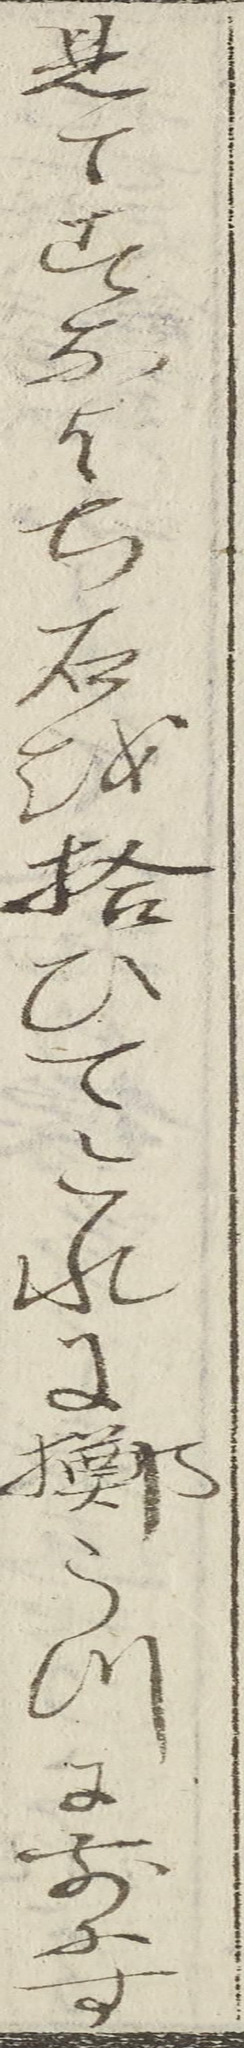見てすなはち石を拾ひてこれに擲らつに前にす
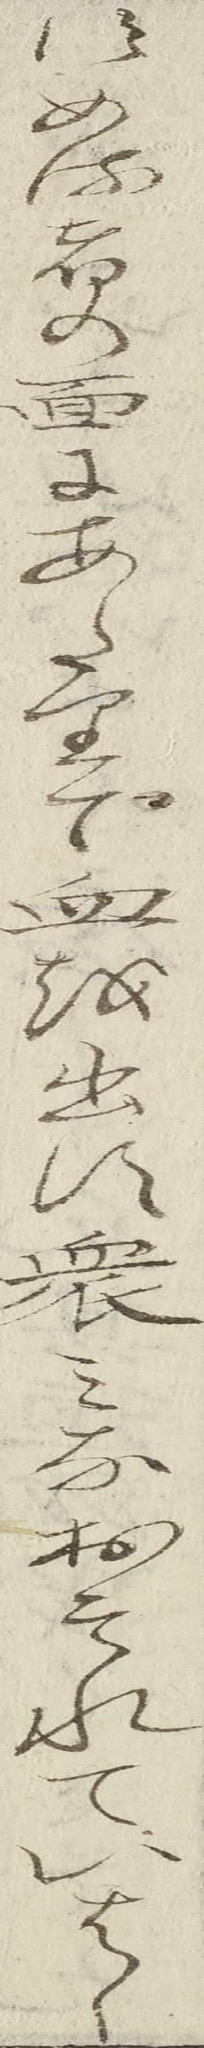すめる者の面にあたりて血を出す衆ミなおそれていはく
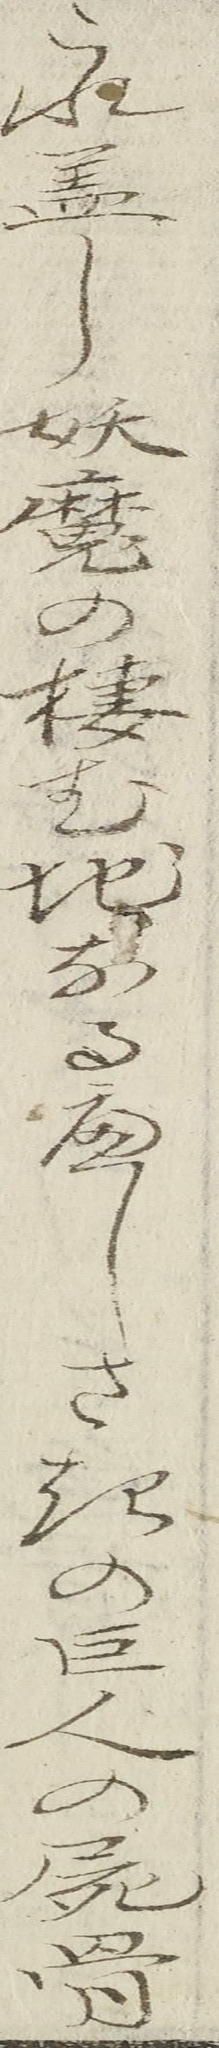これ蓋し妖魔の棲む地なるへしさきの巨人の屍骨
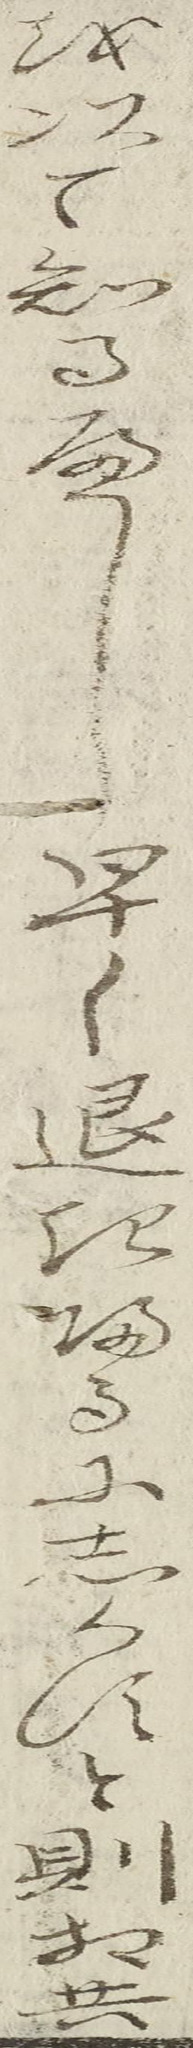を以て知るへし早く退き帰るにしかすと則相共
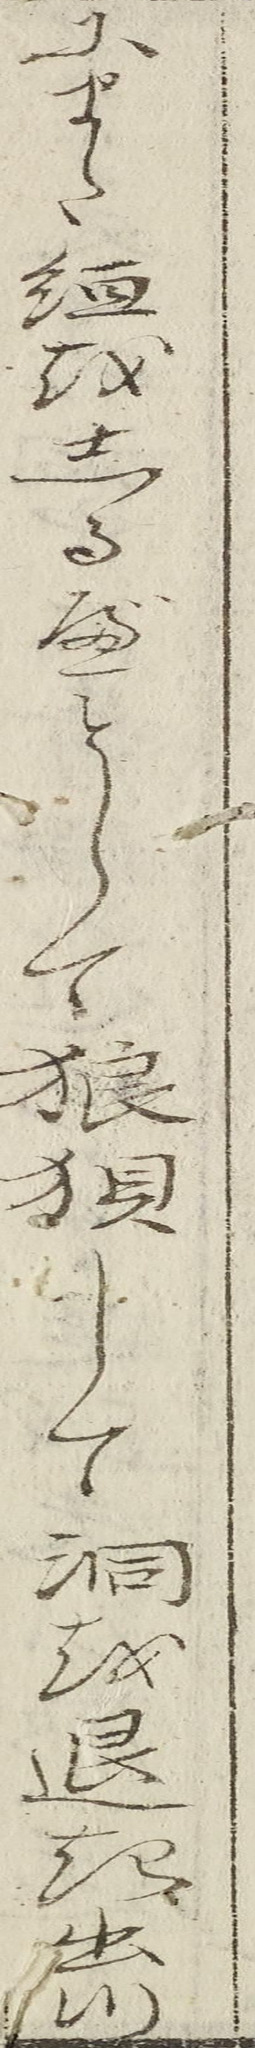にまた絙をしるべとして狼狽して洞を退き出つ
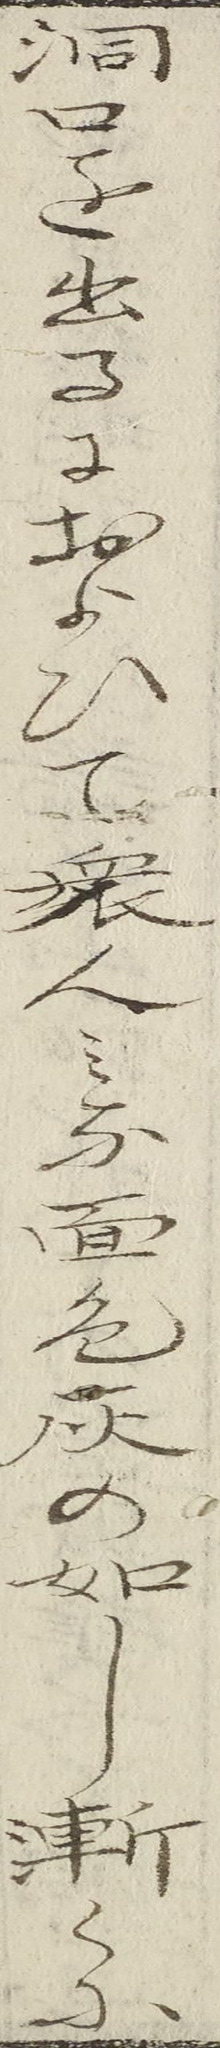洞口を出るにおよひて衆人ミな面色灰の如し漸くに
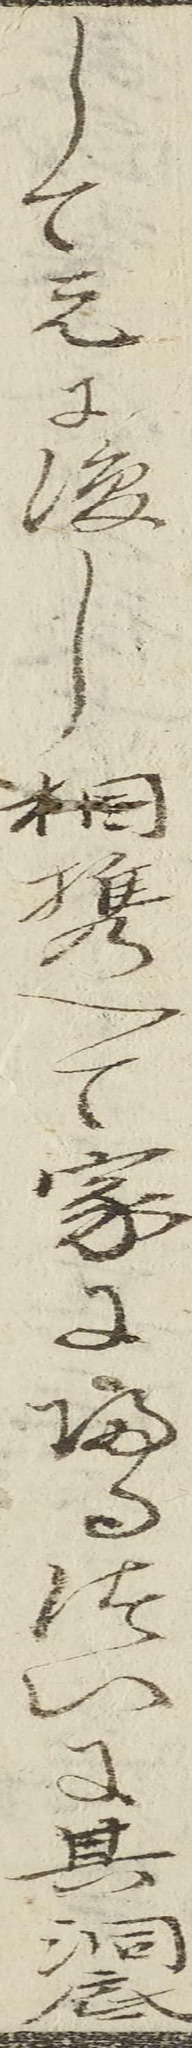にして元に復し相携へて家に帰るついに其洞底
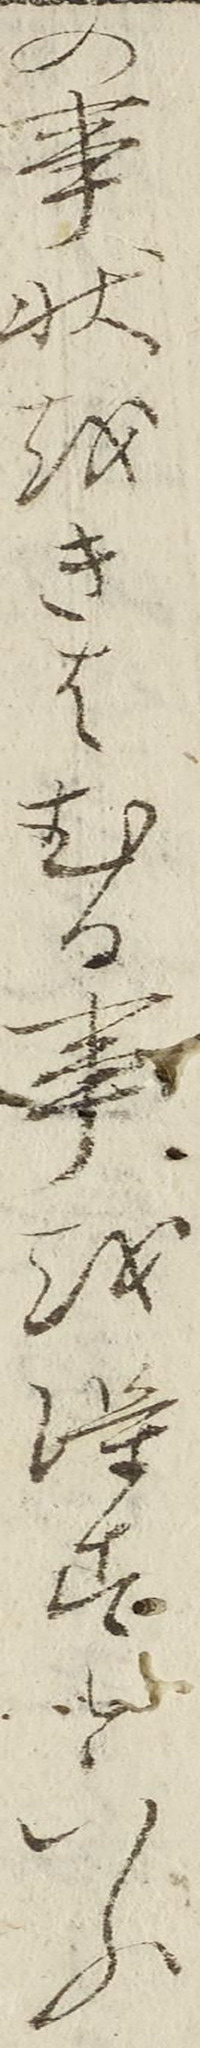の事状をきはむる事を得すといふ
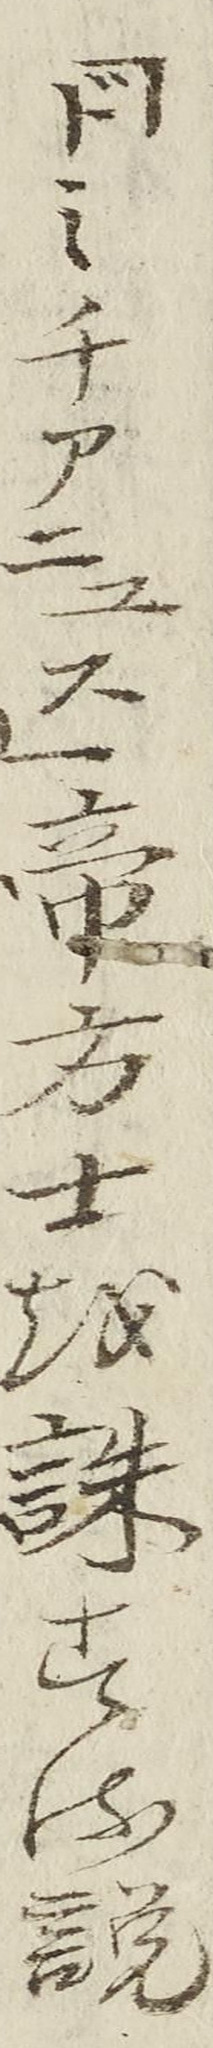「ドミチア二ュス」帝方士を誅する説
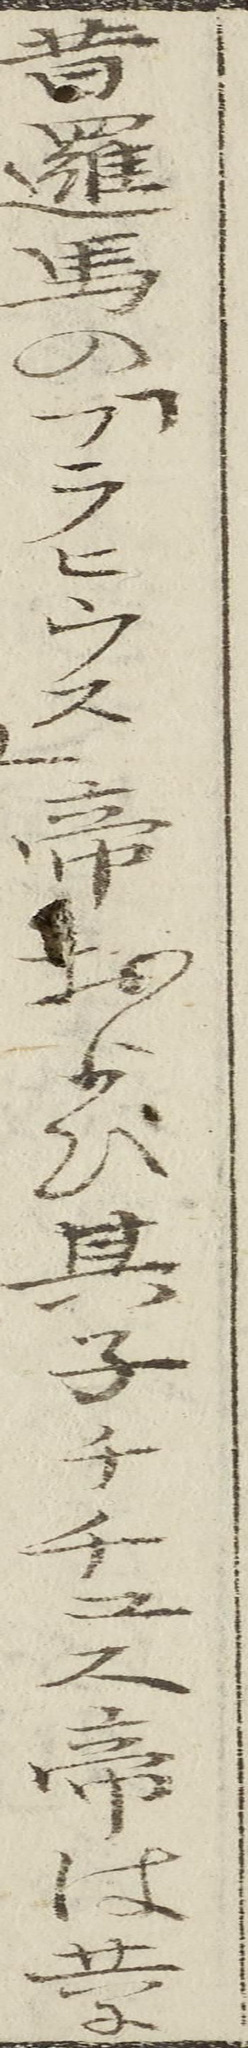昔邏馬の「フラヒウス」帝およひ其子チチュス」帝は共に
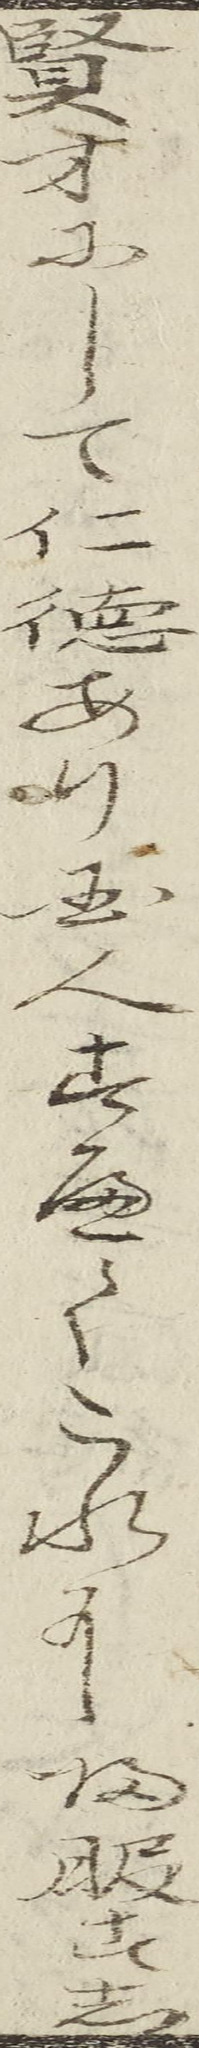賢才にして仁徳あり国人すへてこれに帰服すし
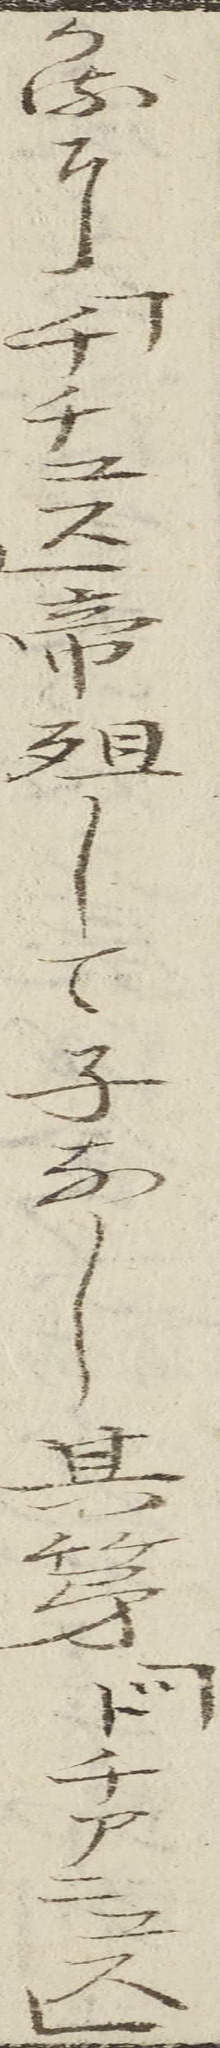かるに「チチュす」帝殂して子なし其弟「ドチア二ュス」
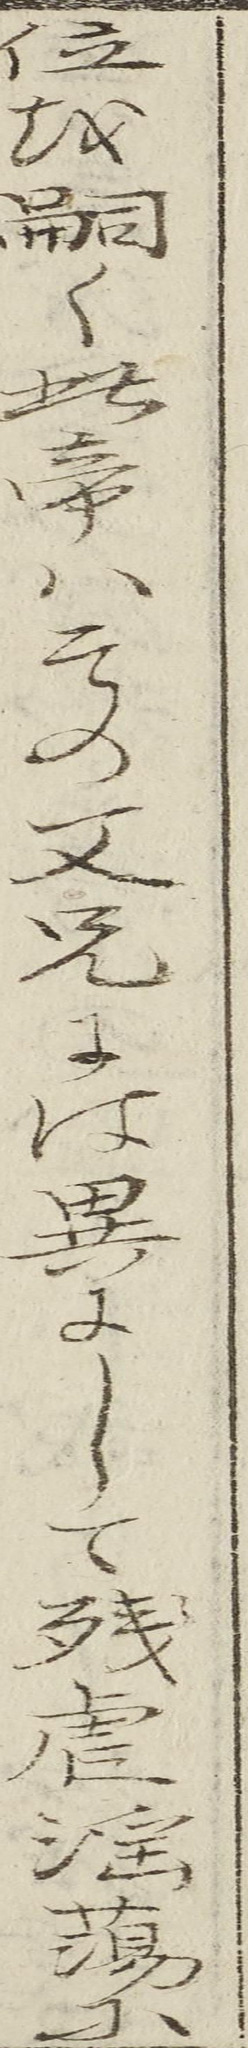位を嗣く此帝ハその父兄には異にして残虐淫蕩に
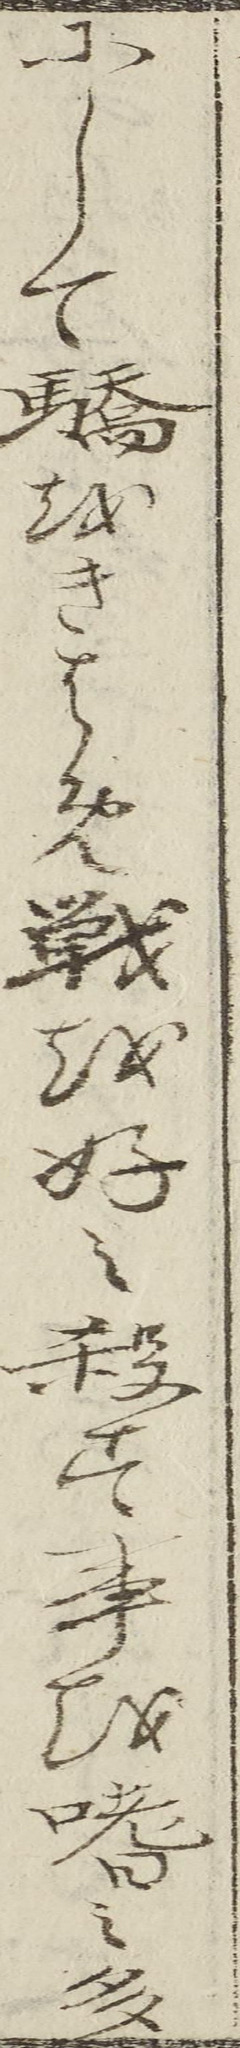にして驕をきはめ戦を好ミ殺す事を嗜ミ多
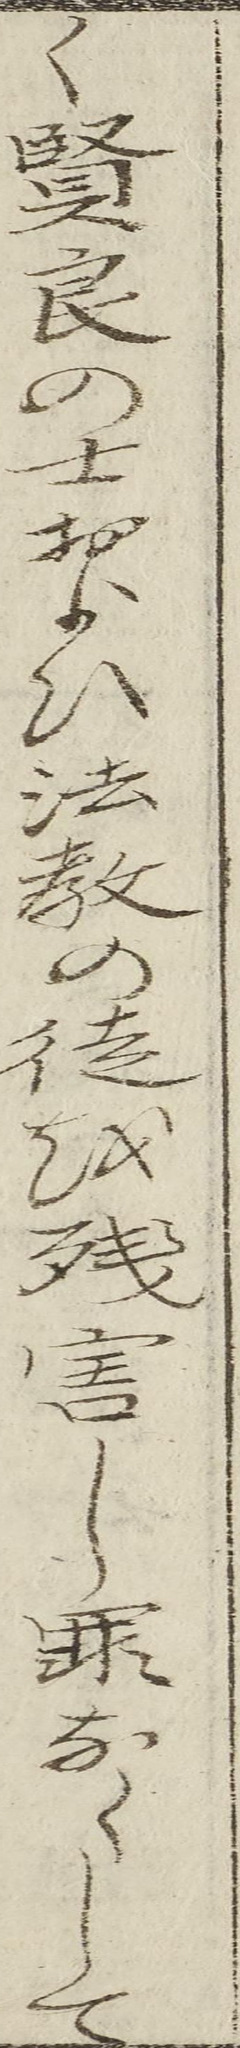く賢民の士およひ法教の徒を残害し罪なくして
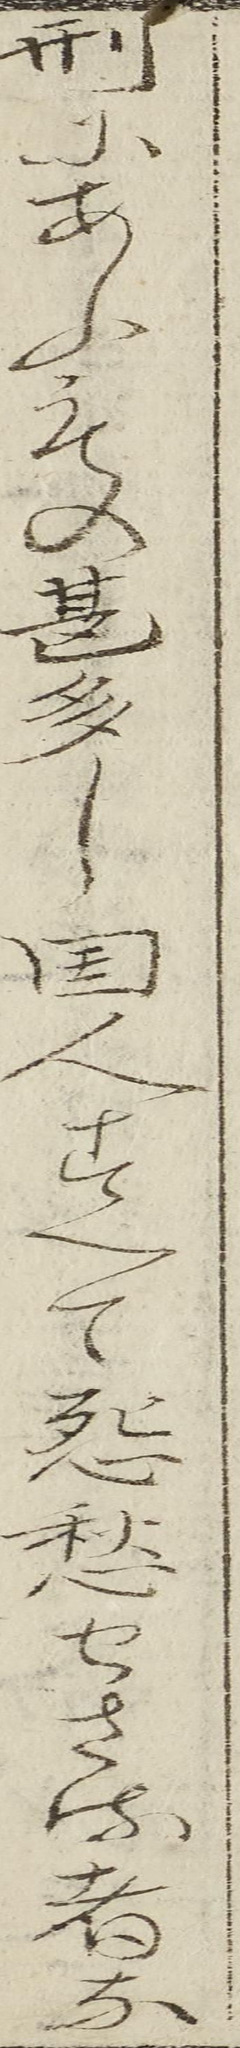刑にあふもの甚多し国人すへて怨愁せさる者な
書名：西洋雜記　乾
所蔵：東京大学地震研究所図書室 Earthquake Research Institute Library, The University of Tokyo, JAPAN
